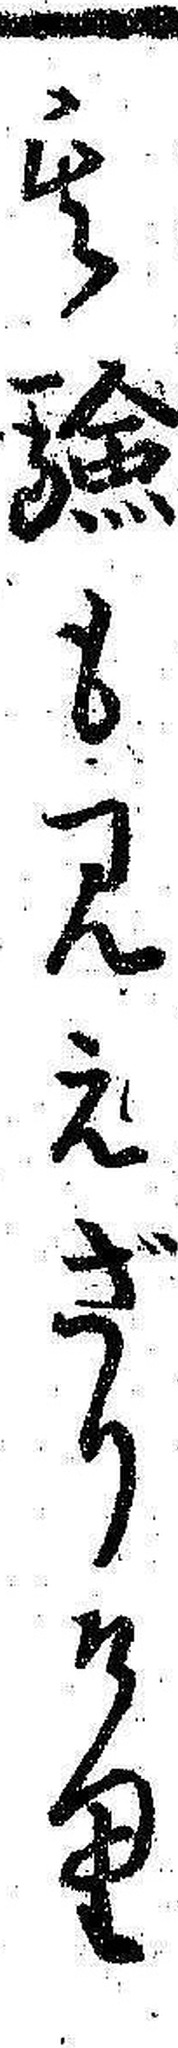其験も見えざりけり

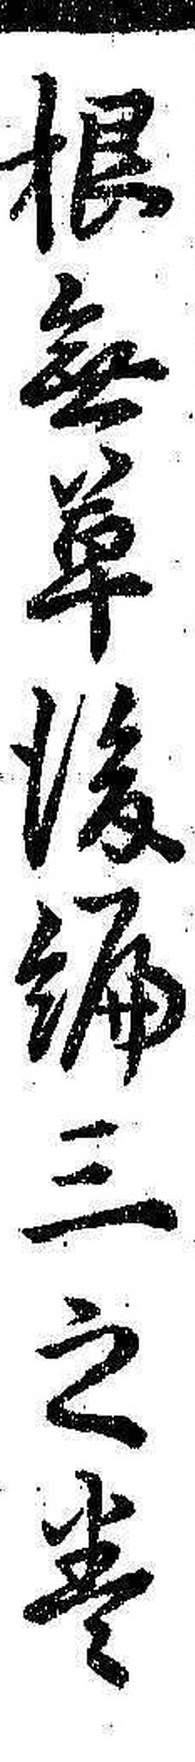根無草後編三之巻
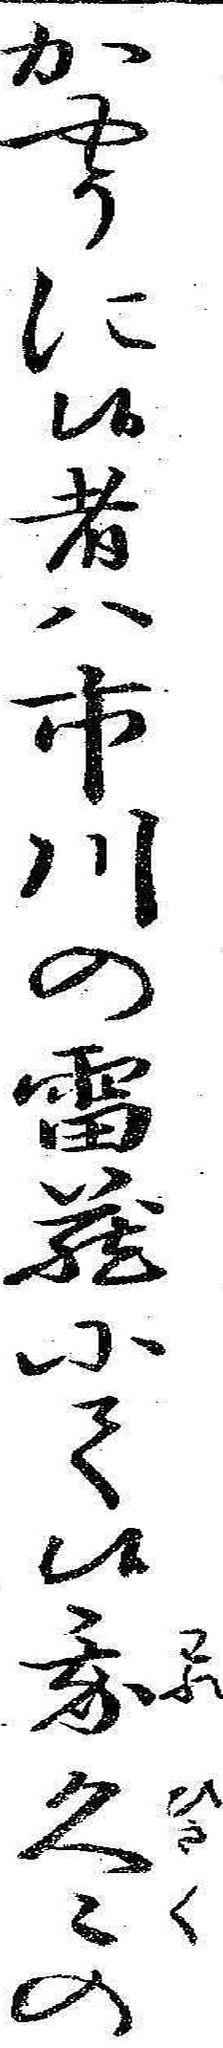かやうに候は市川の雷蔵にて候我久々の
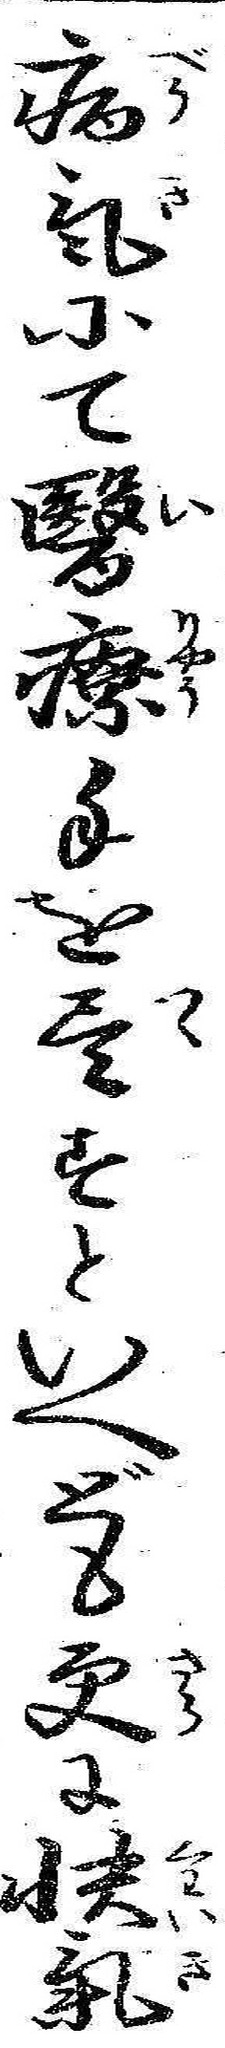病気にて医療手を尽すといへども更に快気
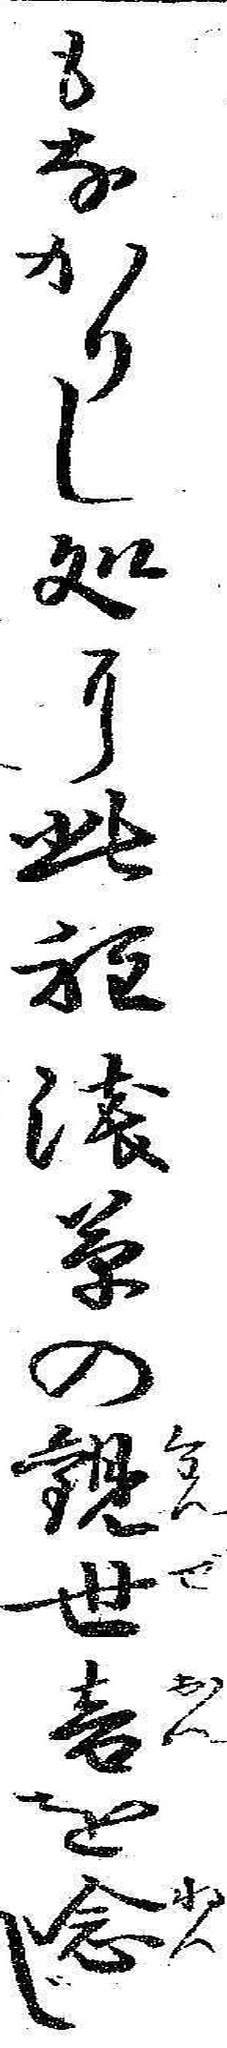もなかりし処に此程浅草の観世音を念じ
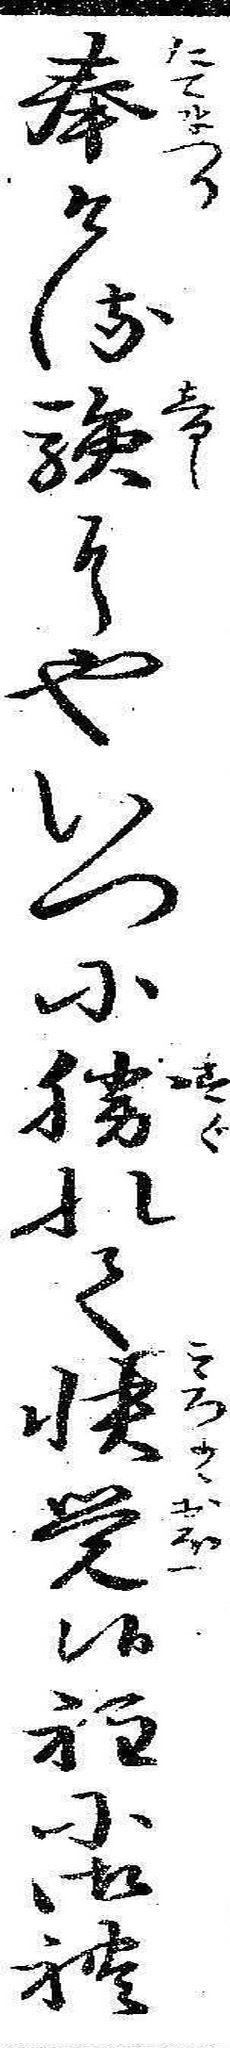奉ける験にやいつに勝れて快覚候程に御礼
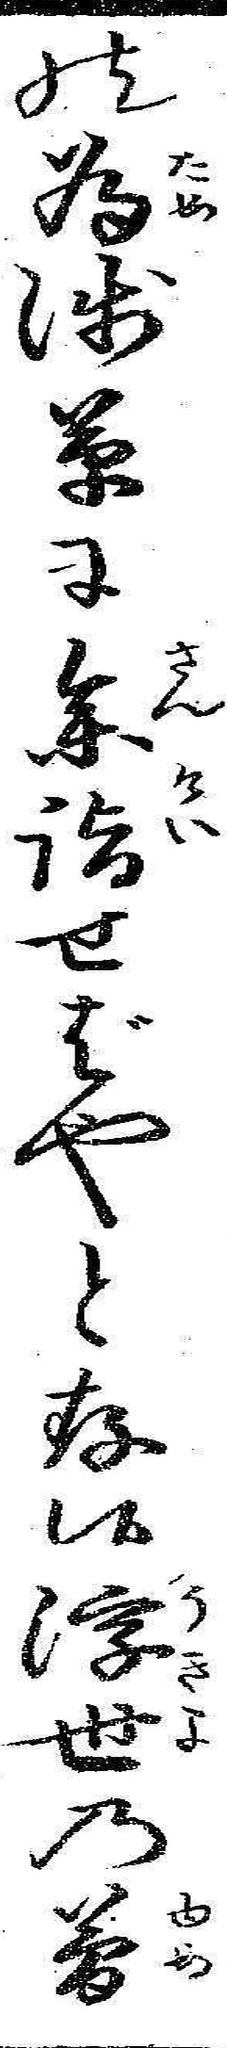の為浅草に参詣せばやと存候浮世の夢
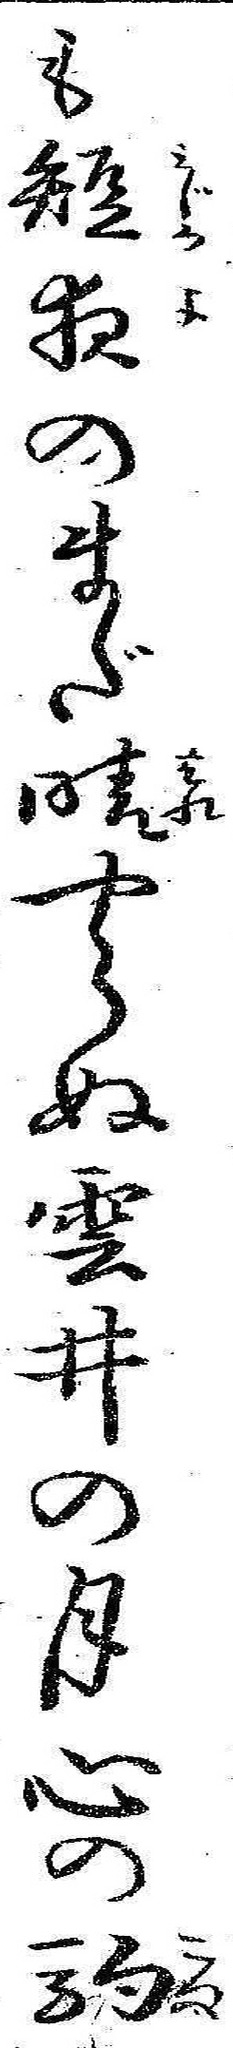も短夜のまだ晴やらぬ雲井の月心の駒
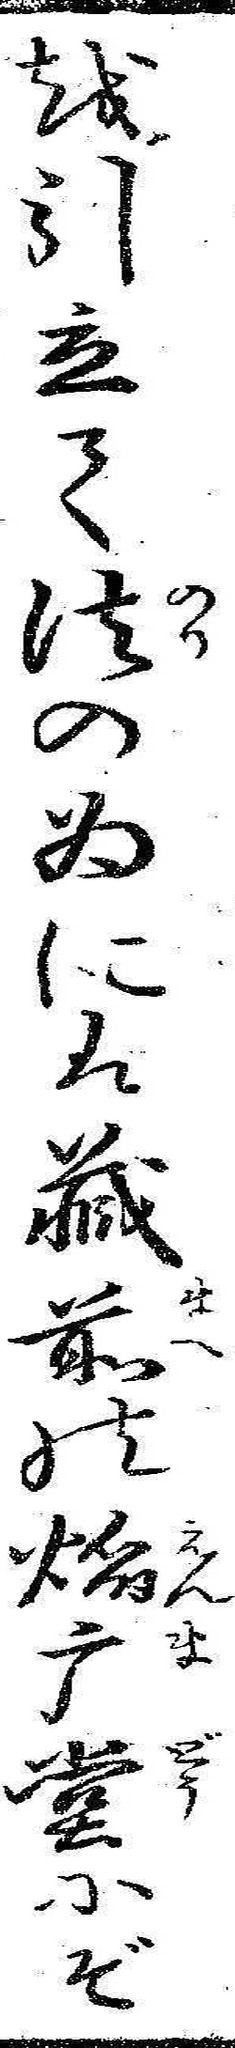を引立て法の為には蔵前の焔魔堂にぞ
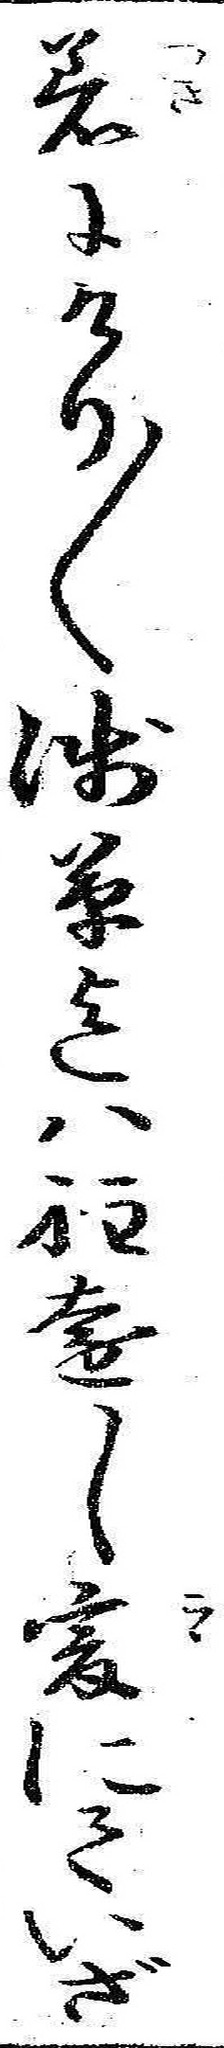着にけり〱浅草迄は程遠し爰にていざ
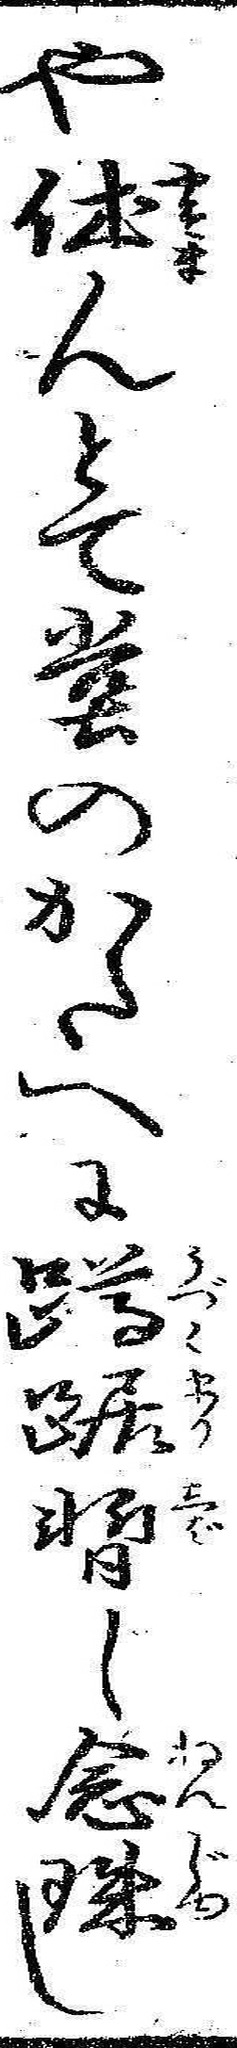や休んとて堂のかたへに蹲踞暫し念珠し

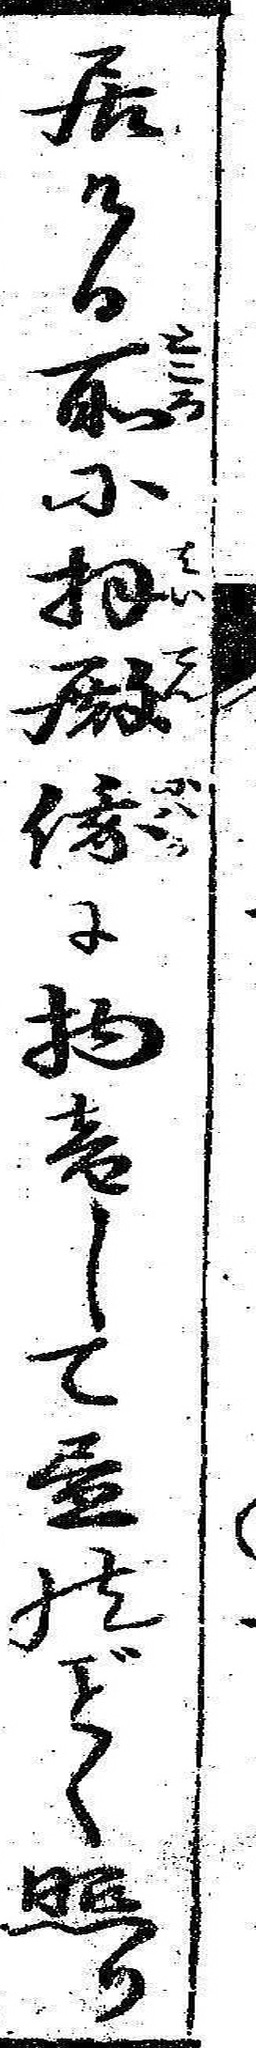居ける所に拝殿俄に物音して昼のごとく照り
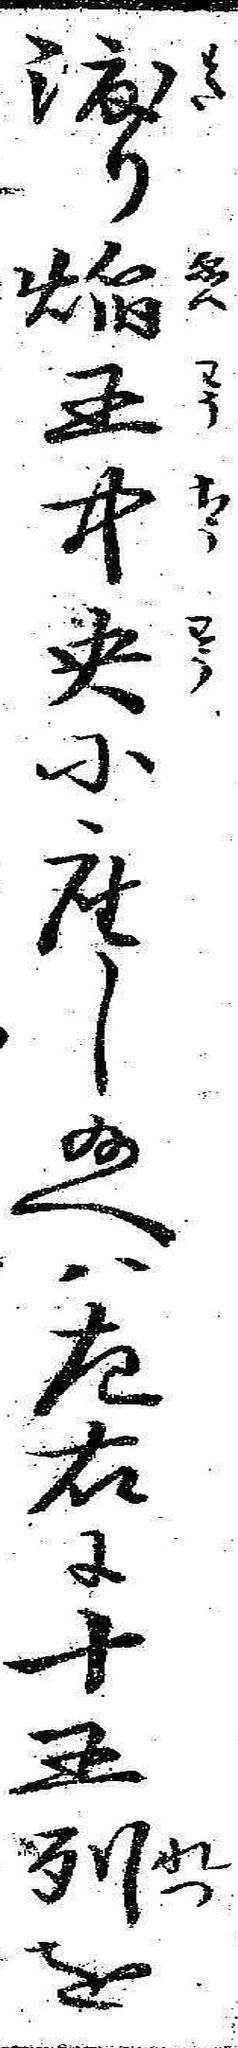渡り焔王中央に座し給へは左右に十王列を
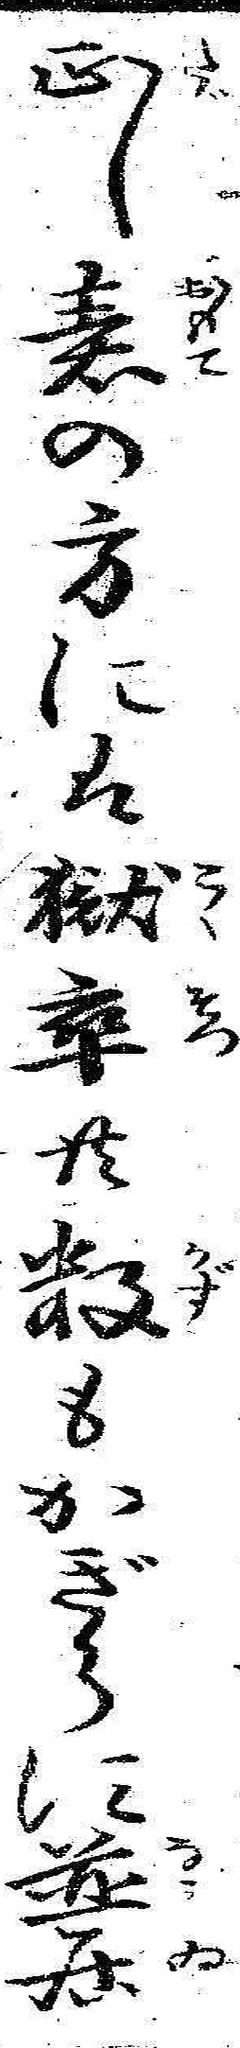正し表の方には獄卒共数もかぎらす並居
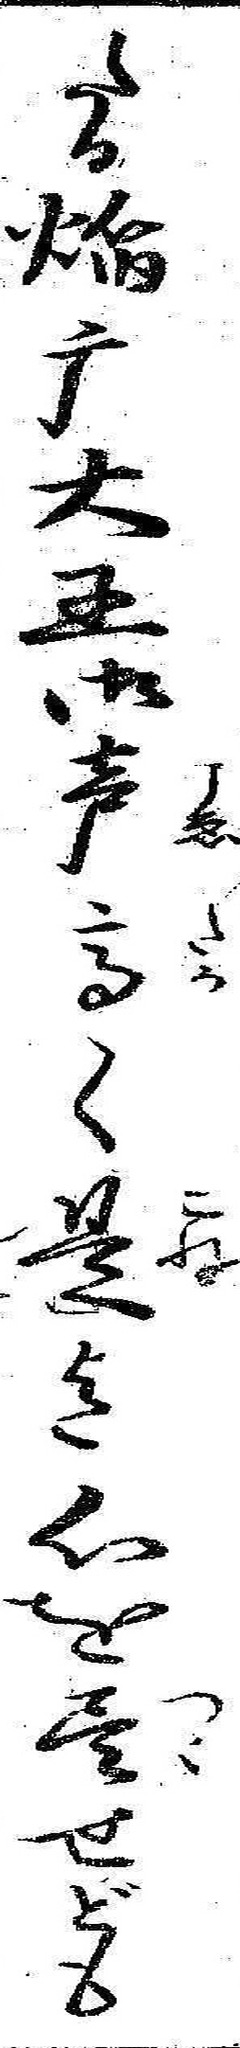たる焔魔大王御声高く是迄心を尽せども
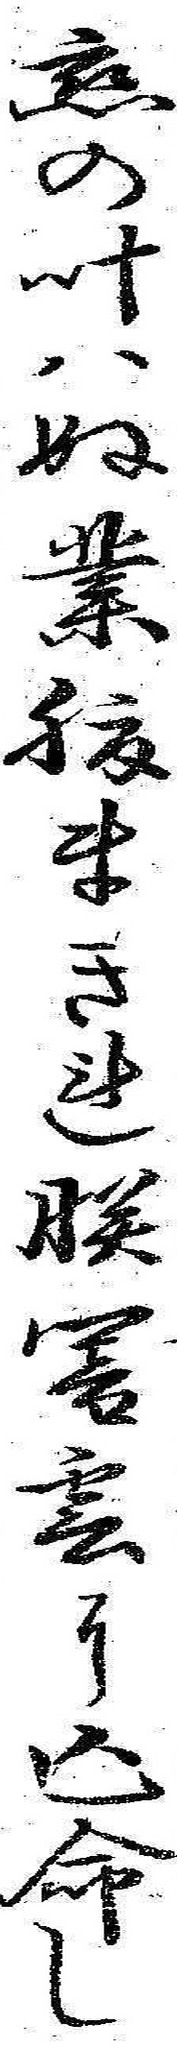恋の叶はぬ業腹まきれ朕闇雲に亡命し
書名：根無草後編
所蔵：国文学研究資料館
